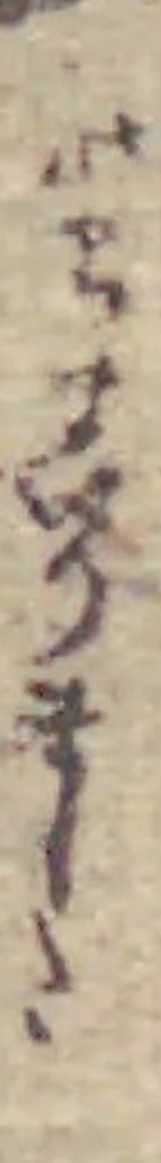此間まいりました
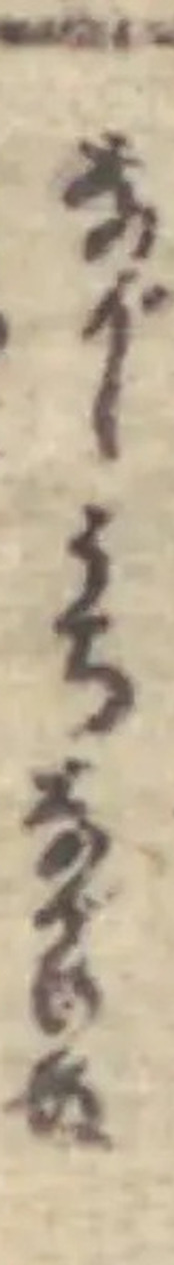ながしうちながめぬ
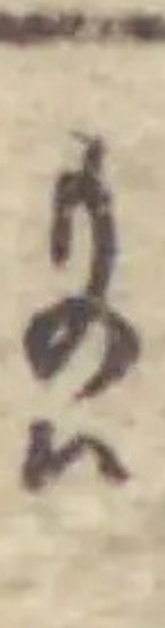ものは
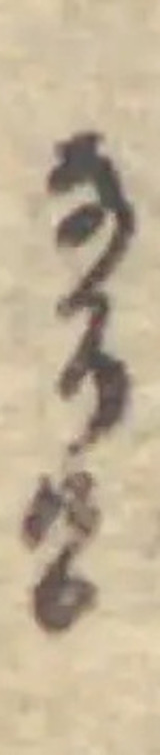なかりける
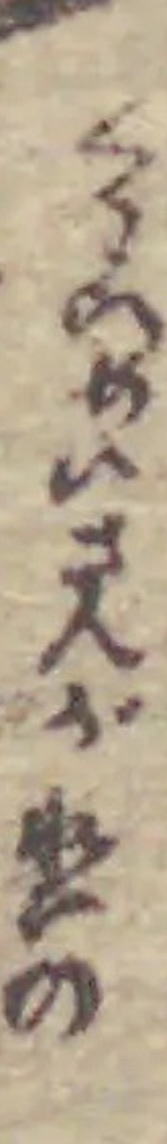くわいめいさんがれいの
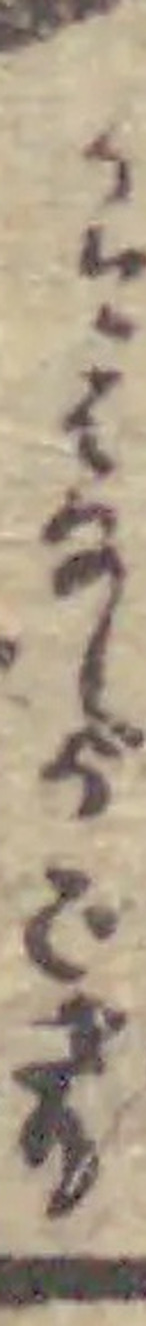かけはなしがござり
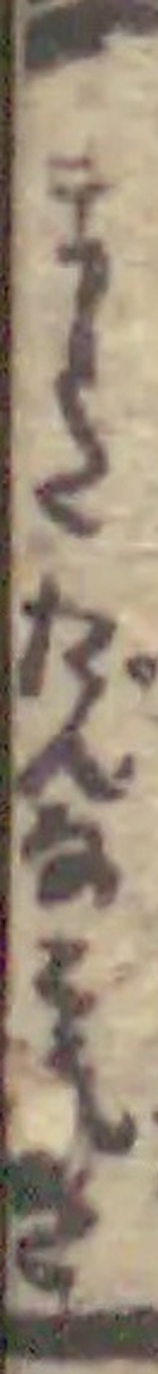ましただんなこき
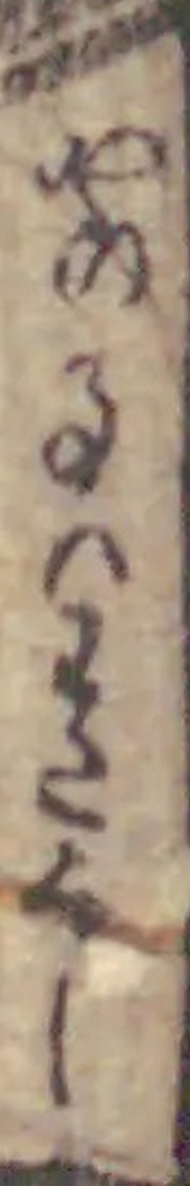やの事はわたくし
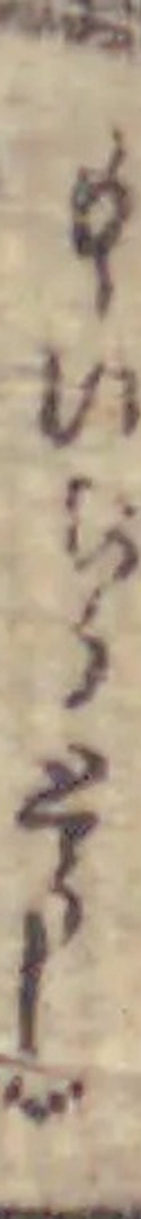もゝけぢうとうしが
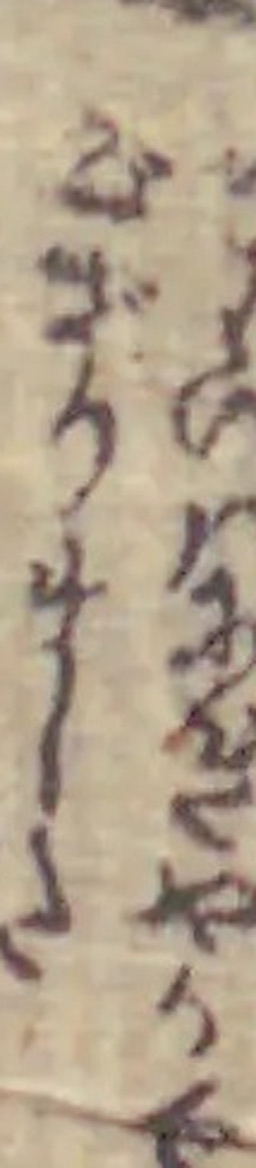ござりました
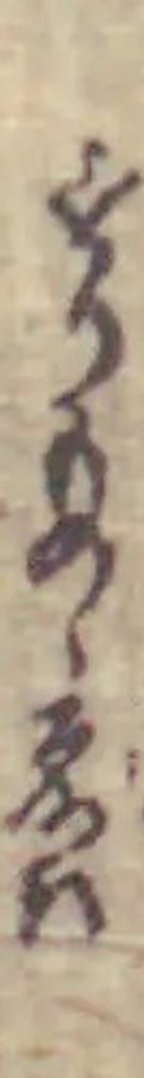すりものゝゑは
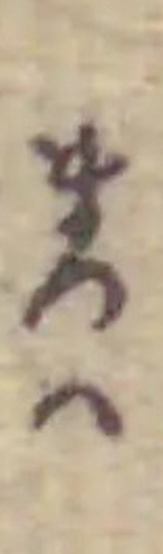まつは
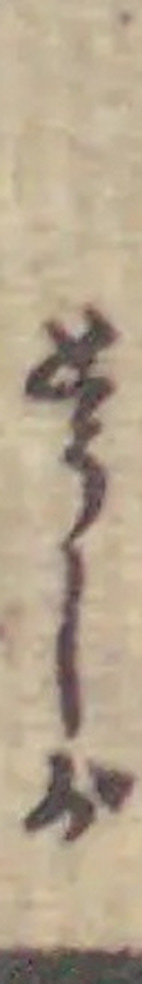とうしが
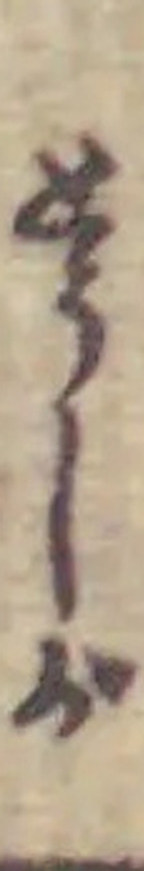とうしが
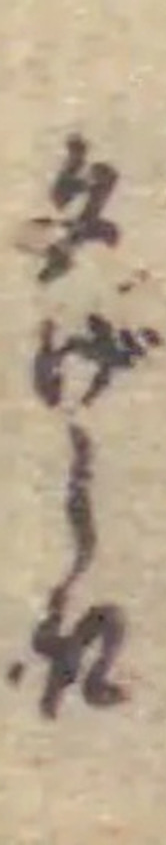夕げしき

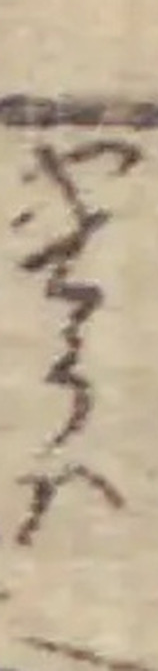やてうは
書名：夜野中狐物 2巻
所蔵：国立国会図書館 National Diet Library, JAPAN
